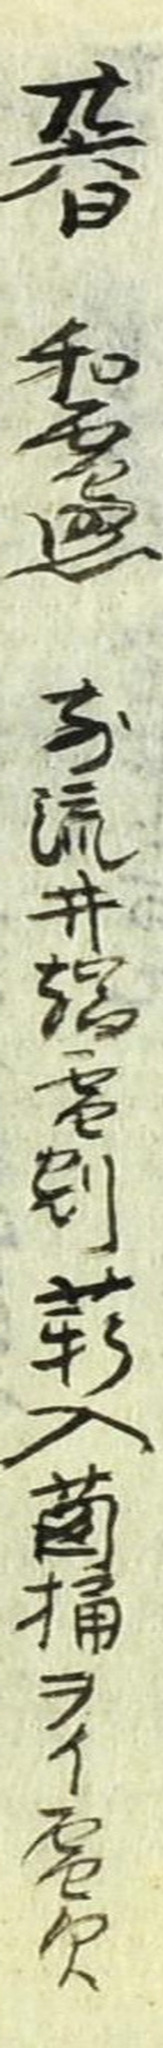廿六日和雪照前流井端雪割薪入桶ヲイ雪欠
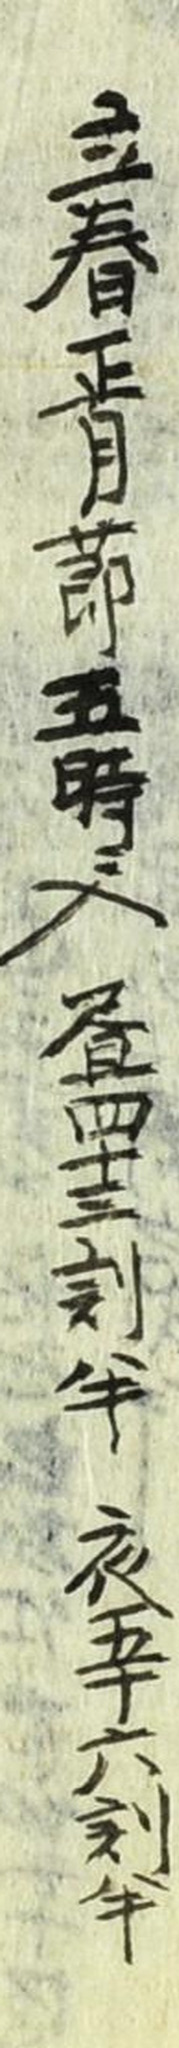立春正月節五時ニ入昼四十三刻半夜五十六刻半
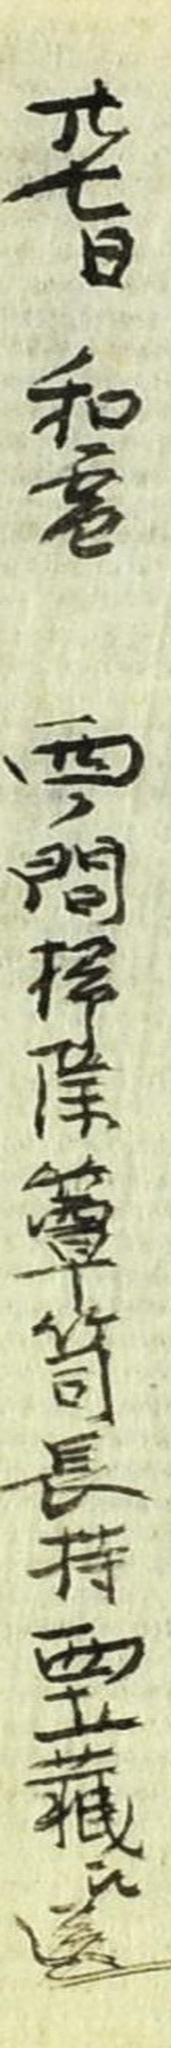廿七日和雪西ノ間掃除箪笥長持西土蔵え送
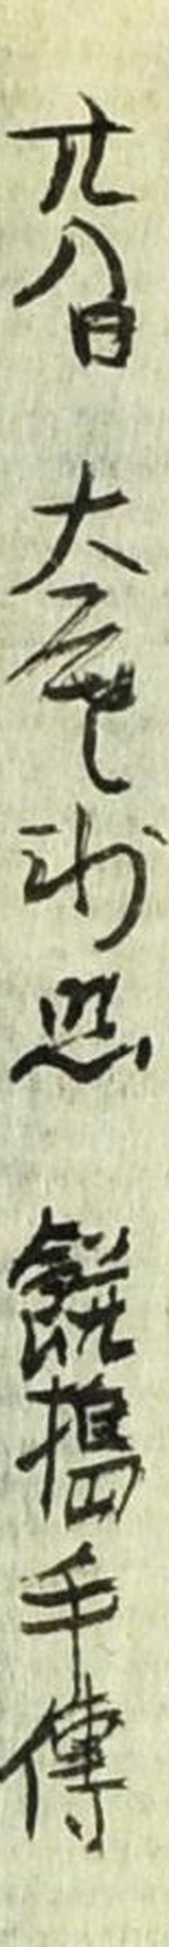廿八日大寒氷照餅搗手伝
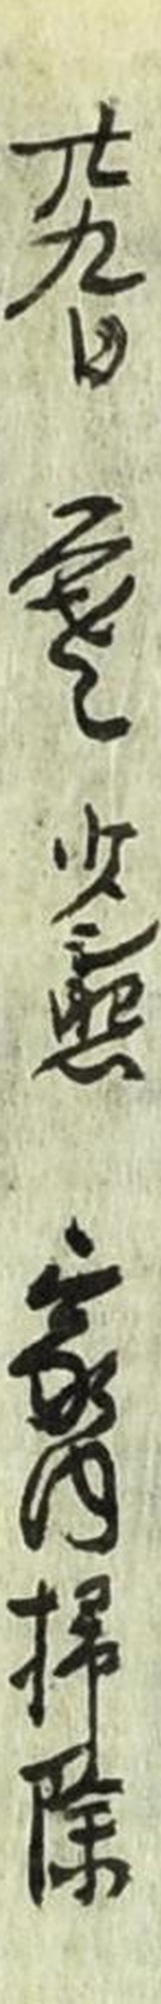廿九日寒少シ照家内掃除
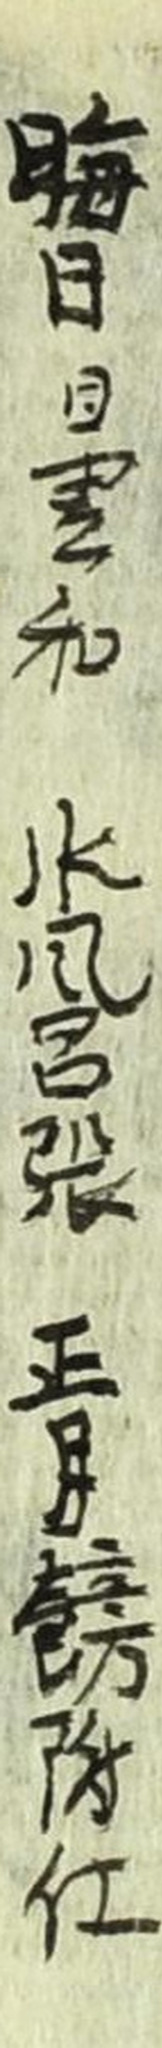晦日曇和水風呂張正月飾附仕

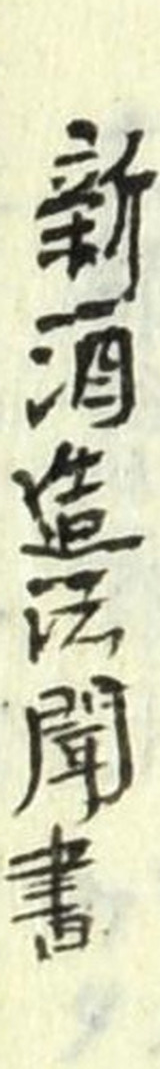新酒造法聞書
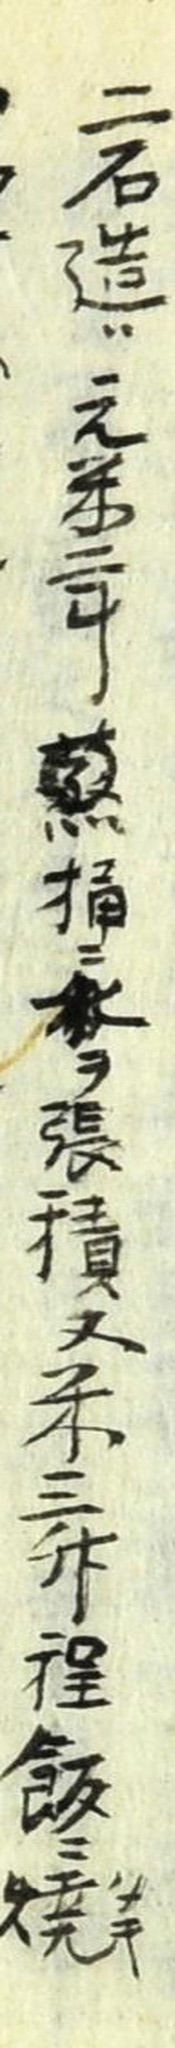二石造ハ元米二斗桶ニ水ヲ張積又米三升程飯ニ焼
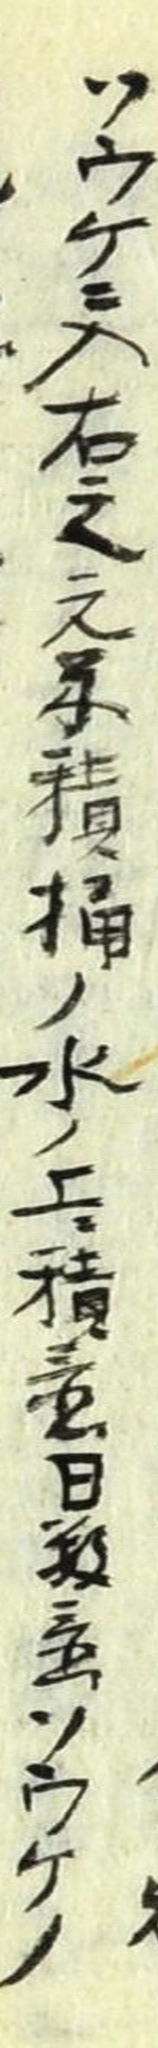ソウケニ入右之元米積桶ノ水ノ上ニ積置日数置ソウケノ
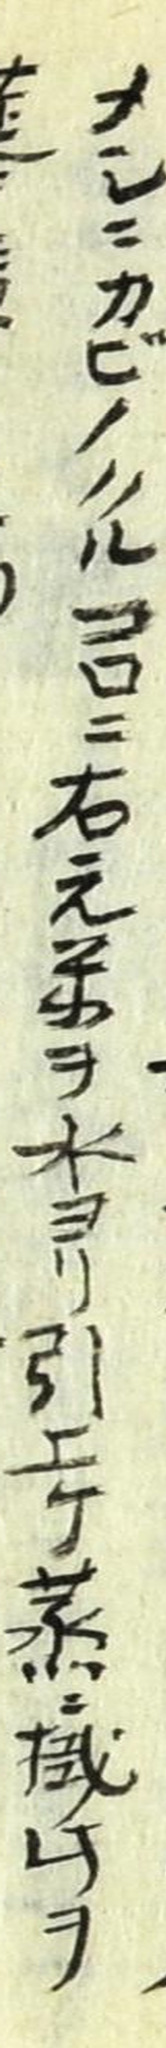メシニカビノクルコロニ右元米ヲ水ヨリ引上ケ蒸ニ掛此ヲ
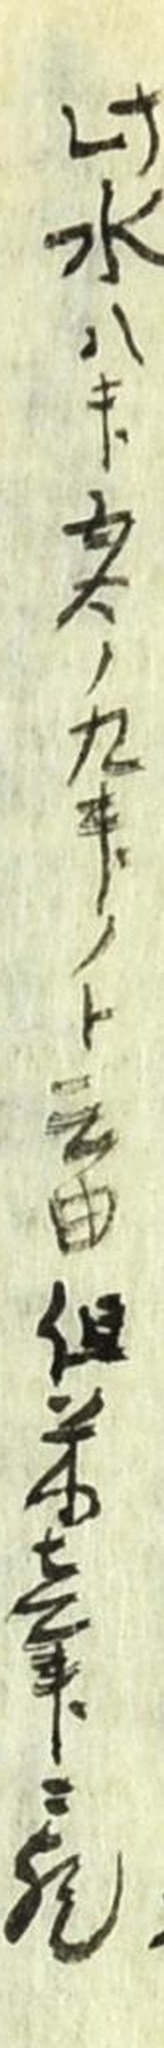此水ハ八升五合ノ九升ノト云由但米壱升ニ歟
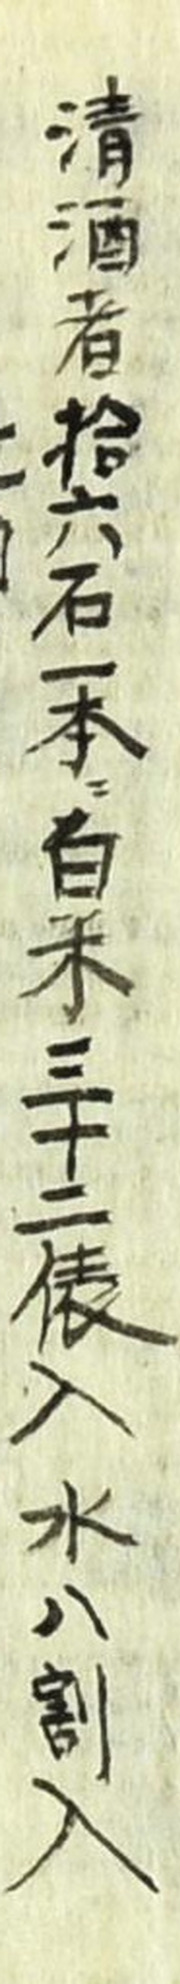清酒者拾六石一本ニ白米三十二俵入水八割入
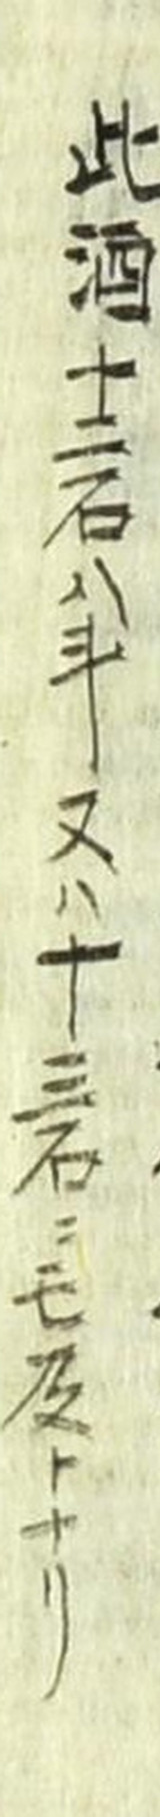此酒十二石八斗又ハ十三石ニモ及トナリ
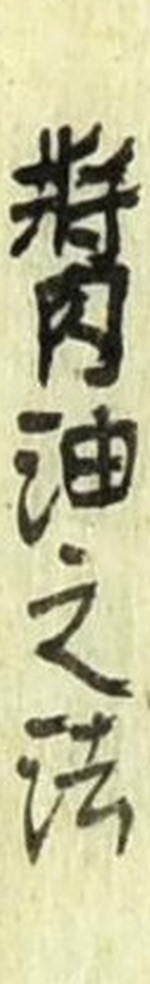醤油之法
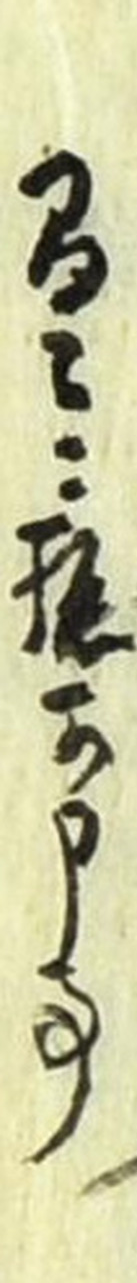間々ニ振可申事
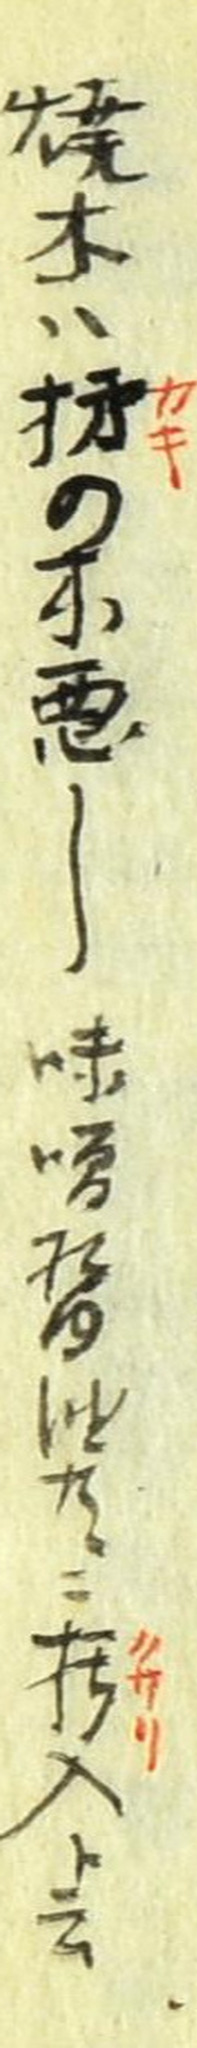焼木ハ柿の木悪し味噌醤油共ニ朽入ト云
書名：（日記）
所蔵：福井県文書館 Fukui Prefectural Archives
